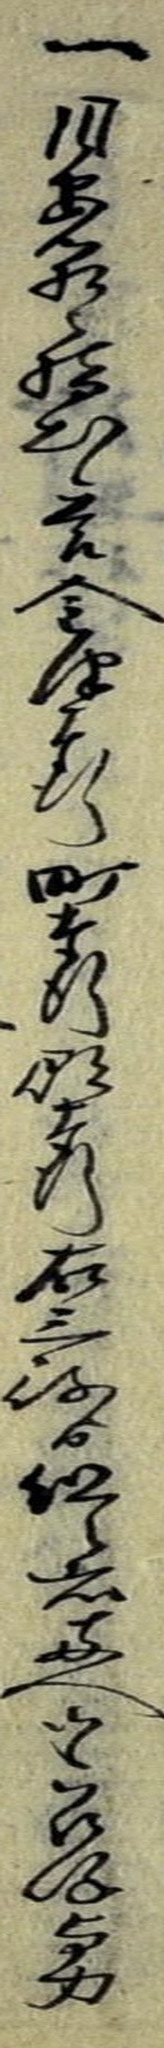一目安箱被指出候節金津奉行町奉行郡奉行右三役ゟ組之者両人ツヽ召呼与力
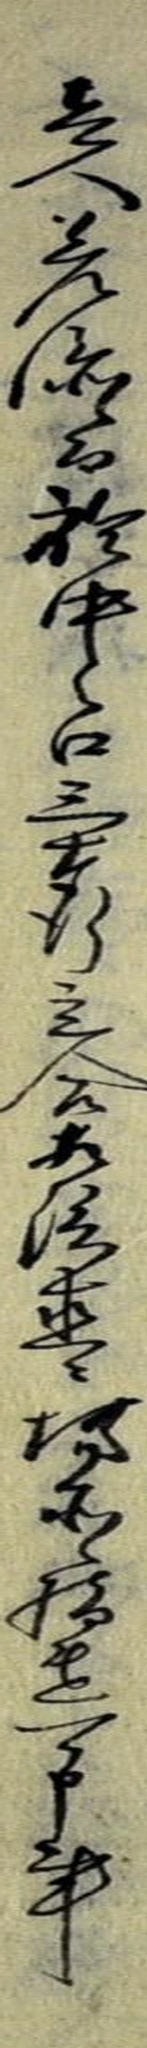壱人差添候而於中之口三奉行立合相渡直ニ場所へ指遣可申事
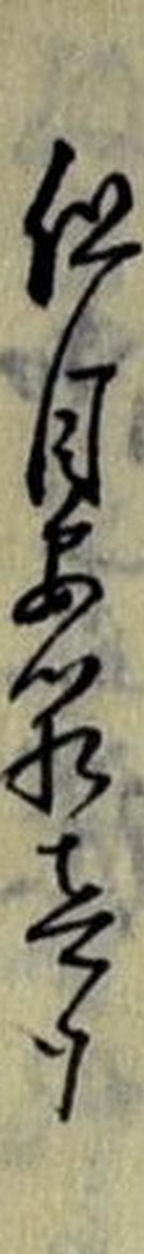但目安箱壱ツ
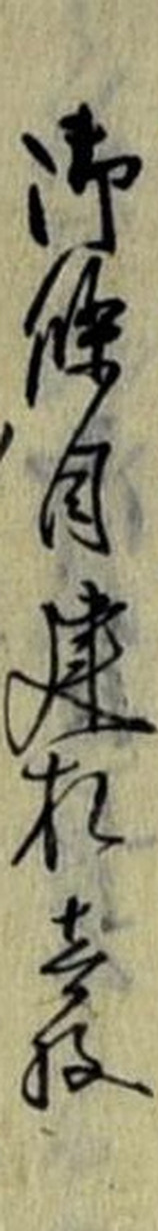御条目建札壱枚
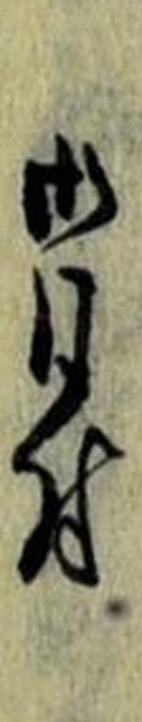御目付
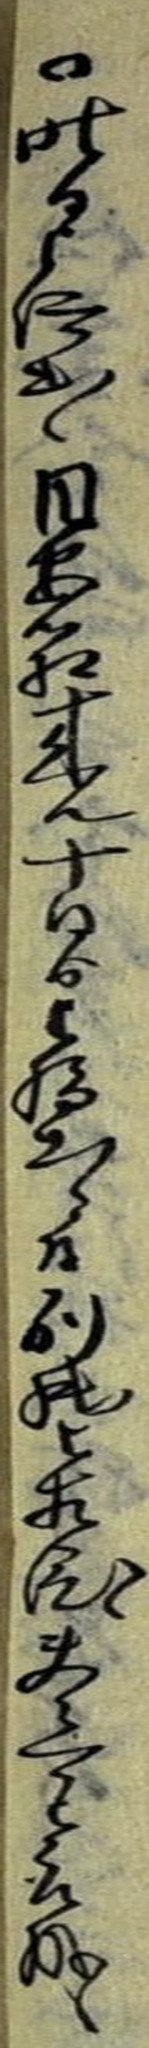〇昨日被仰出候目安箱来ル十日ゟ被指出候ニ付別紙被相渡候夫々可被取扱候
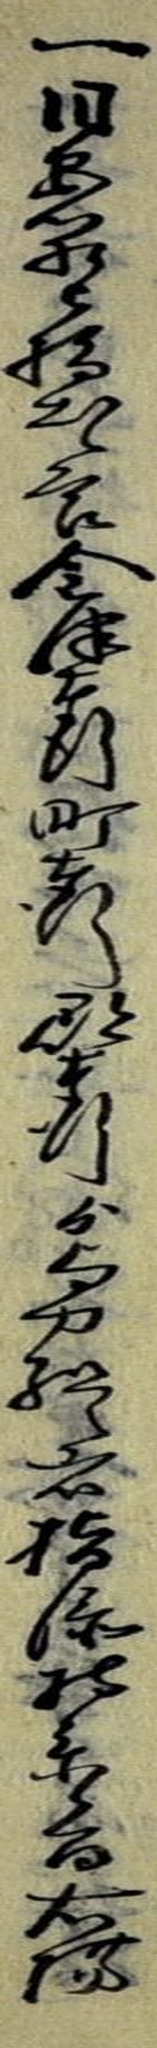一目安箱被指出候節金津奉行町奉行郡奉行ゟ組之者指添持参候間右場
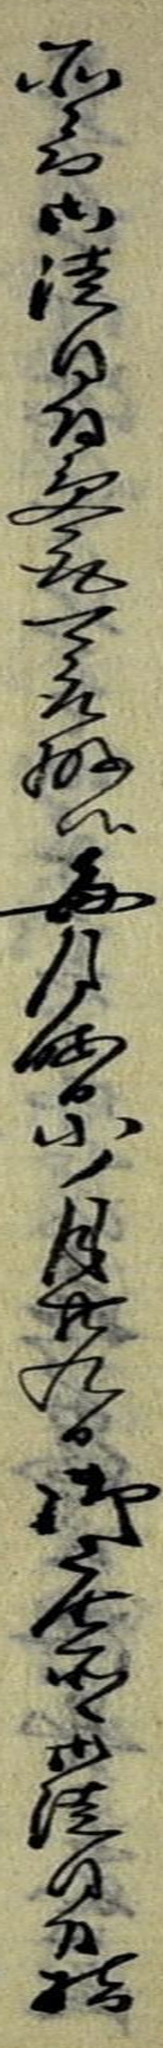所ニ而御徒目付受取可取扱候毎月晦日小ノ月廿九日御座所へ御徒目付指
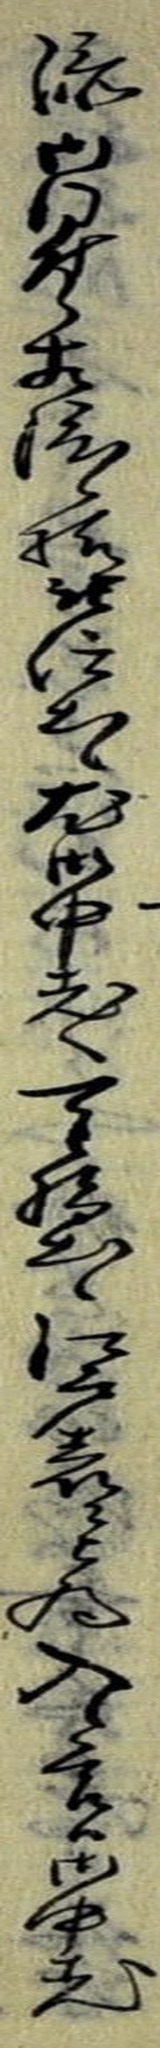添御目付へ相渡候様被仰出候尤御中老へ可被指出候江戸表ニ被為入候節ハ御中老
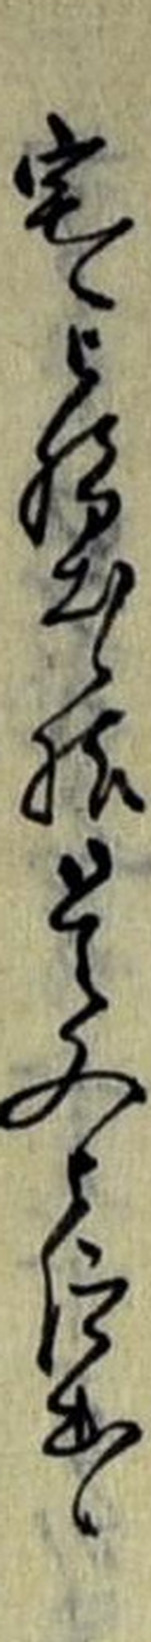宅へ被指出候様是又被仰出候
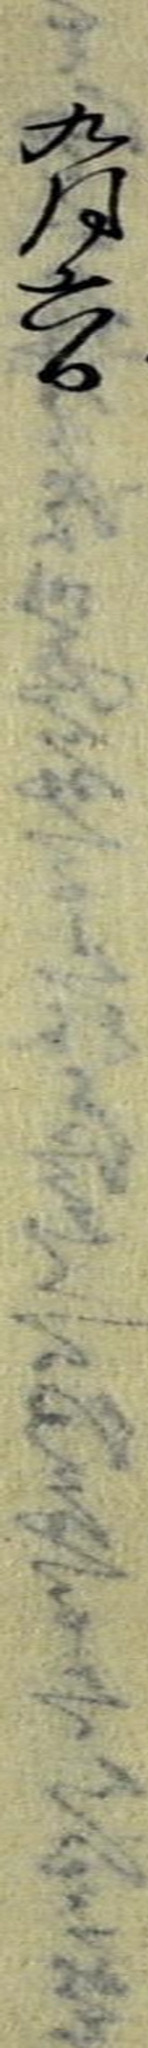九月六日
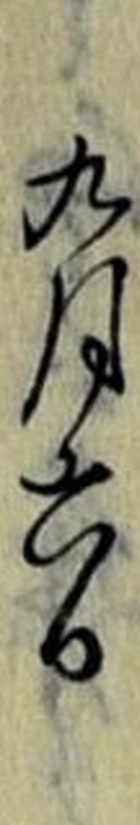九月六日
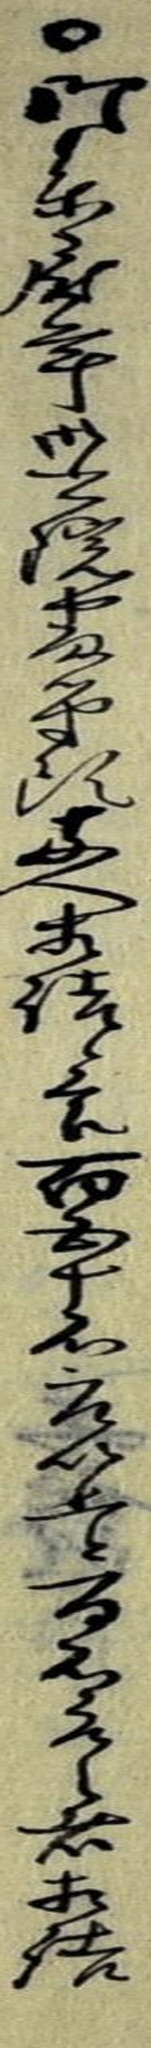〇御参府年御書院番筆頭両人相詰候節百五十石取以上と百石取之者相詰
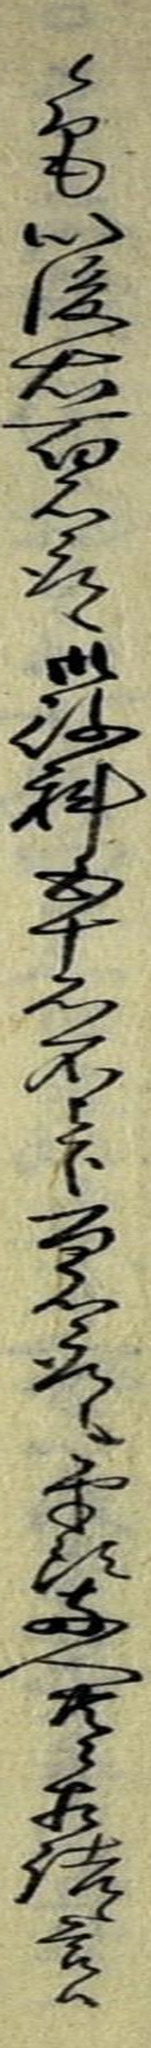候而も以後右百石取へ御役料五十石不被下百石取之筆頭両人共ニ相詰候節ハ
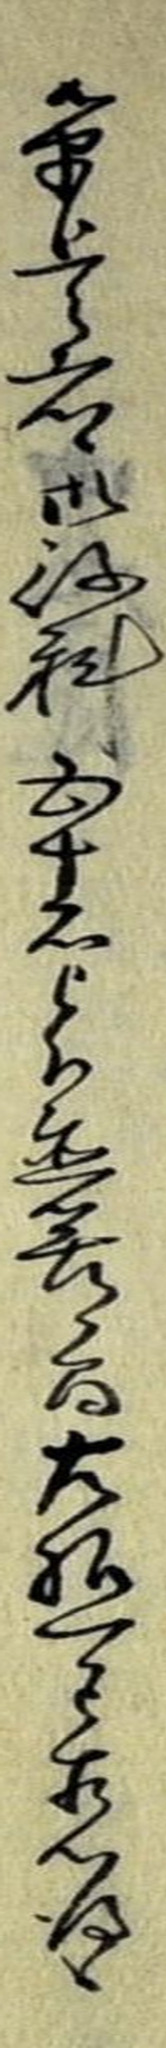筆上之者へ御役料五十石被下置筈候間左様可被相心得候
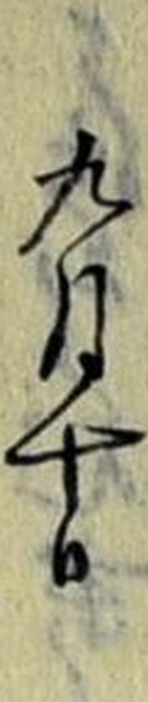九月十日
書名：命令之部 三
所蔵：福井県文書館 Fukui Prefectural Archives
